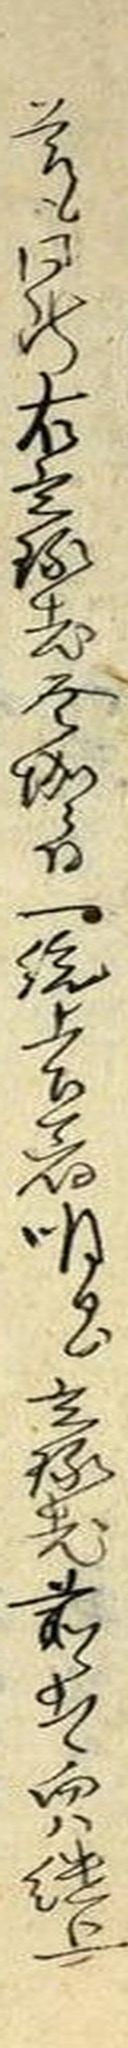節も同断右玄琢老登城ニ付一統上下着明日ゟ玄琢老前へ出候向ハ継上
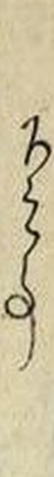下之事
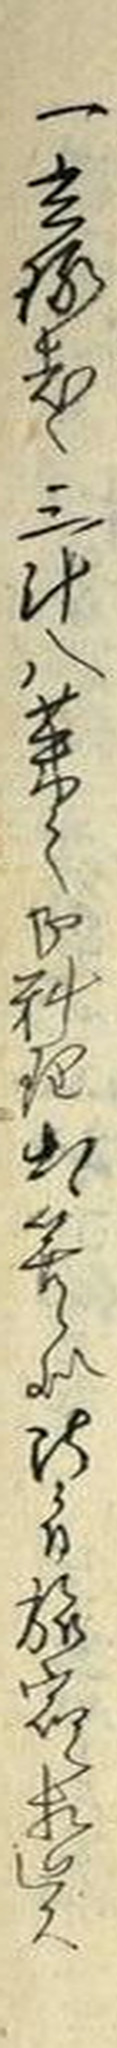一玄琢老へ三汁八菜之御料理出候筈之処断ニ付旅宿へ相廻ス
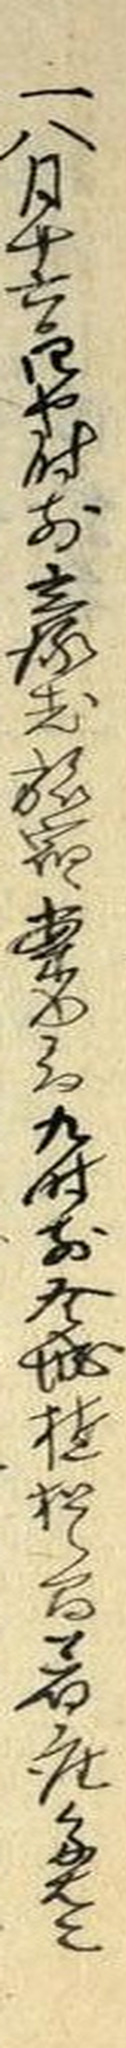一八月十六日四半時前玄琢老旅宿へ案内ニ而九時前登城韃靼之間着座たばこ
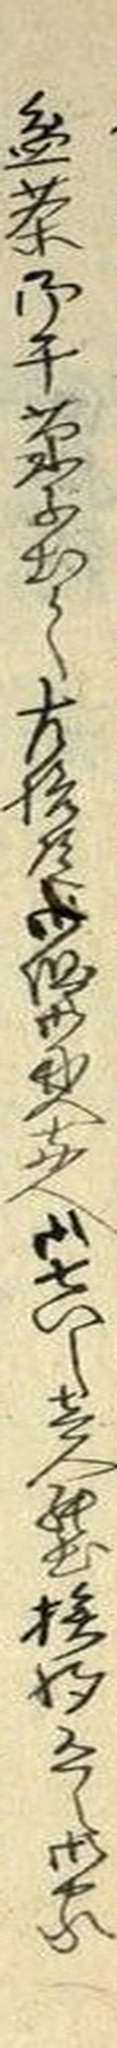盆茶御干菓子出之左膳殿御側御用人両人御匕いし壱人罷出挨拶有之御家
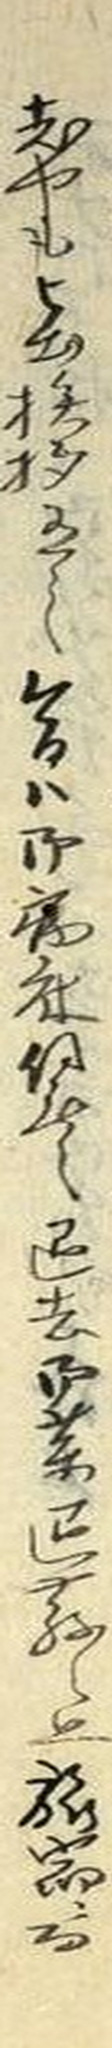老中も被出挨拶有之今日ハ御病床伺無之退去御薬退散之上旅宿ニ而
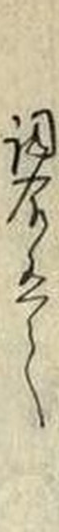調合有之
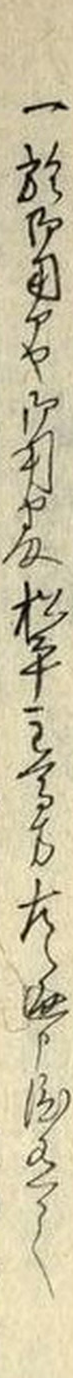一於御用部や御用番松平主馬方左之通申渡有之
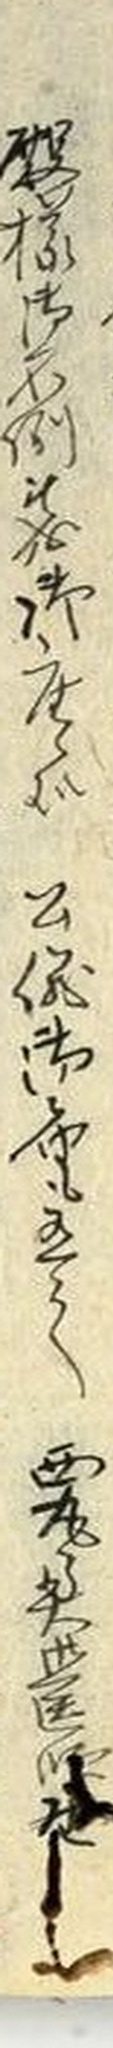殿様御不例被成御座候処公儀御届も有之西丸奥御医師野
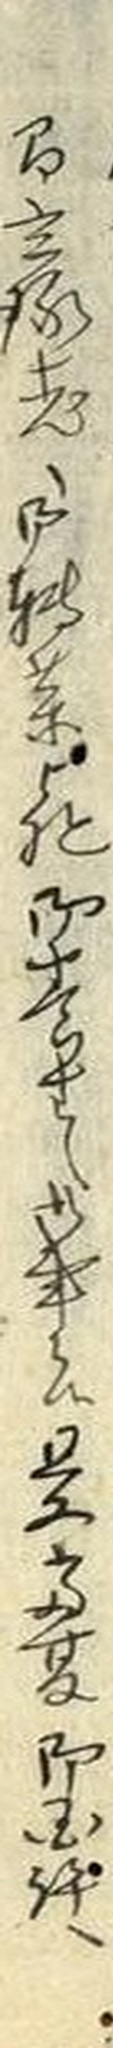間玄琢老へ御転薬被遊御養生之御事ニ候且又当夏御国許へ
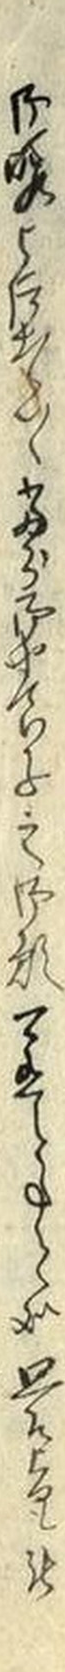御暇被仰出候ハヽ当分御養子之御願可被有之事ニ候処思召旨も被
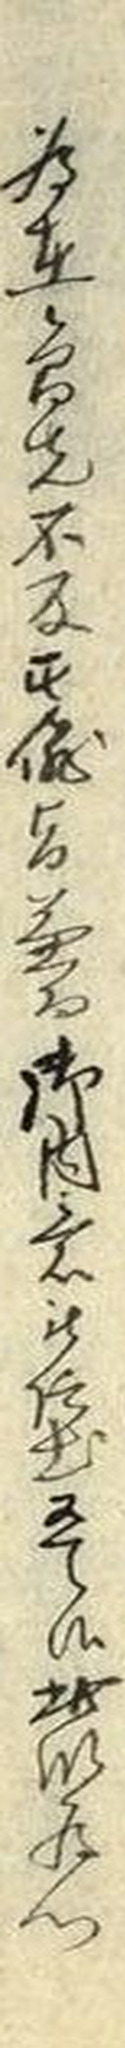為在候間先不及其儀旨兼而御内意被仰出有之候此段為心
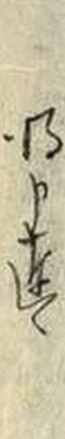得申達候
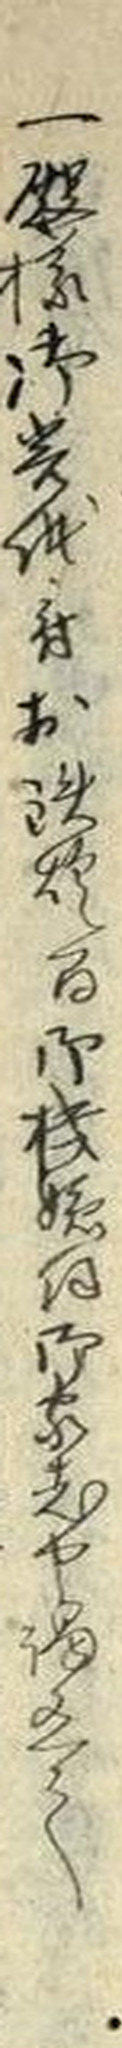一殿様御御容体ニ付於鉄砲之間御機嫌伺御家老中謁有之
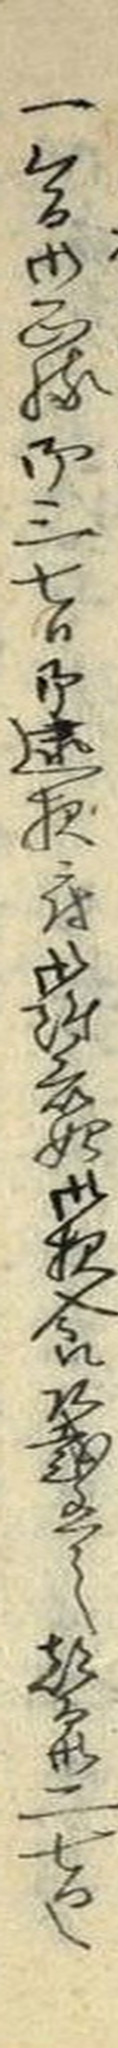一今日御正統御三七日御逮夜ニ付御附衆始御夜食頂戴有之都而御二七日之
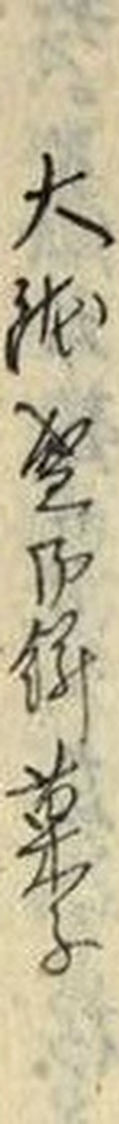大鉢盛御餅菓子二台
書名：少傅日録抄（斉善付側向頭取日記、江戸并道中、初入在国、逝去後…
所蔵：福井県文書館 Fukui Prefectural Archives
